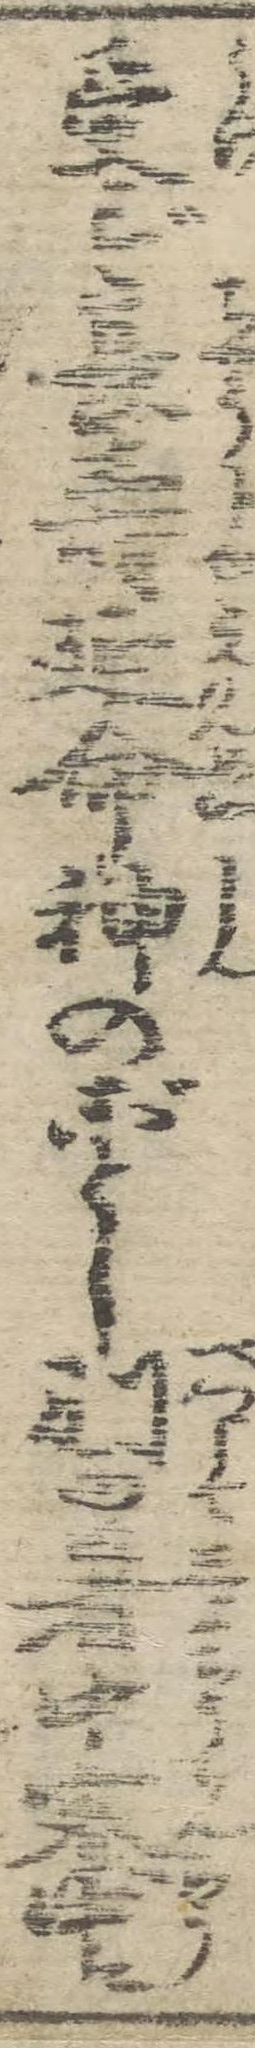受ず長寿延命神のごとし別而暑中寒中に
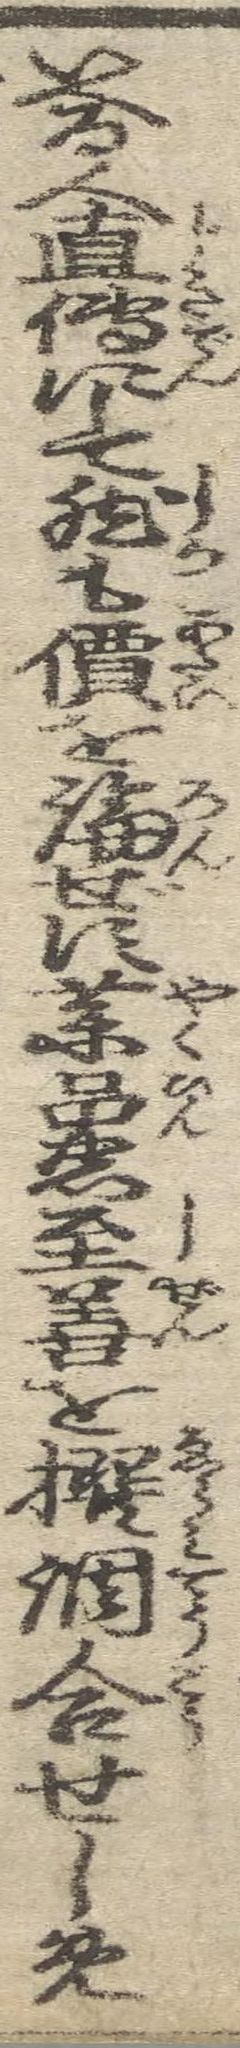いへる人直伝にして然も価を論ぜず薬品の至善を撰調合せしめ
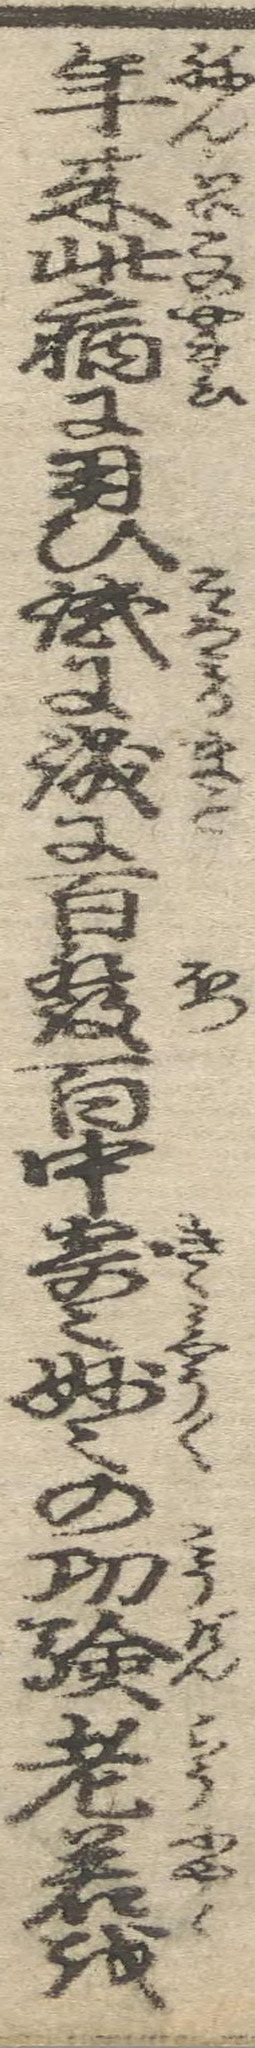年来此病に用ひ試に誠に百発百中寄々妙々の功験老若を
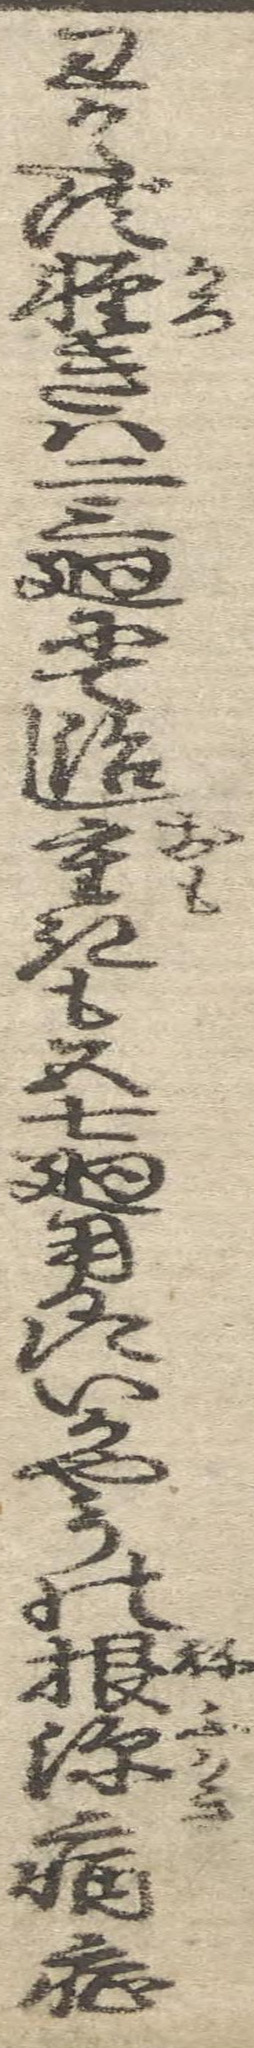わかたず軽きは二三廻にて治し重きも五七廻用るにいかやうの根深病症
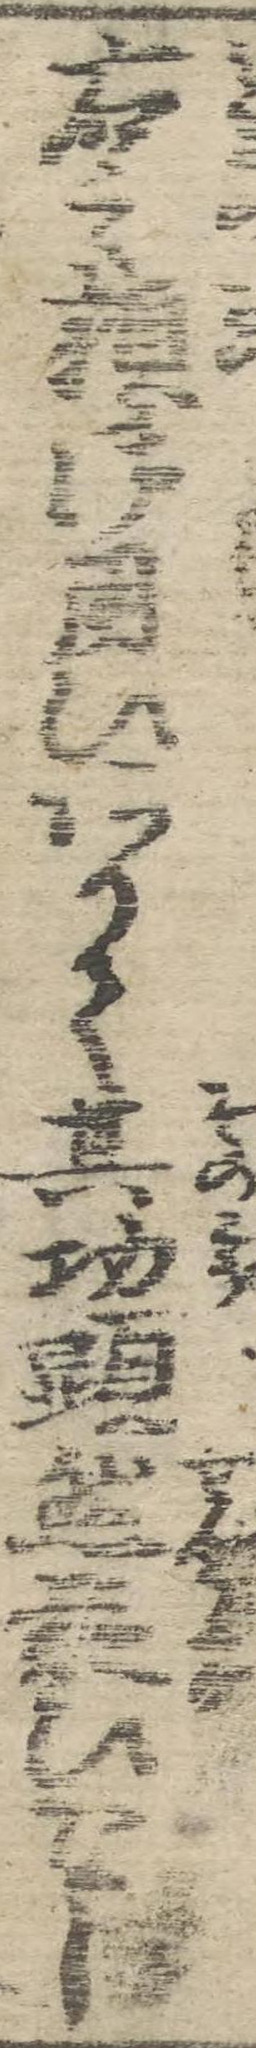右之類御用ひありて其功顕然疑ひなし
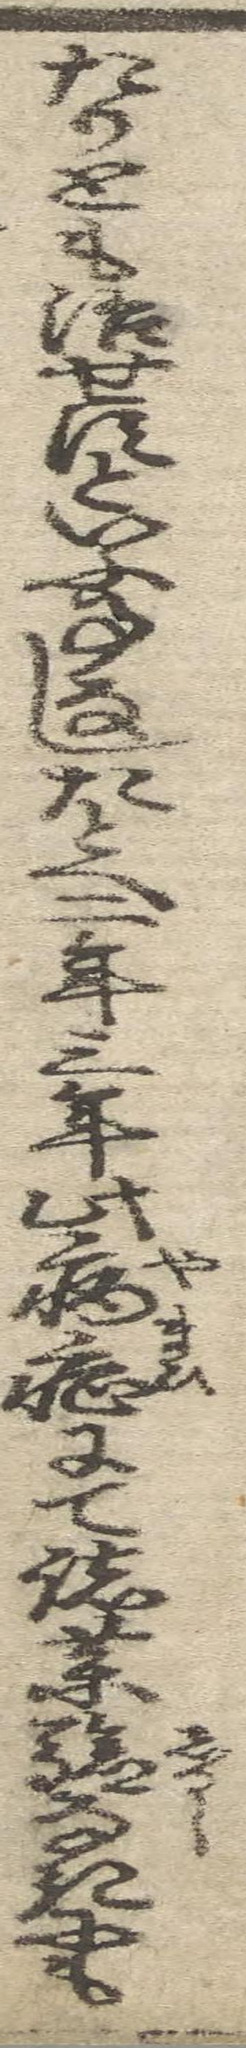たりとも治せすといふ事なしたとへ二年三年此病症にて諸薬験なきにも
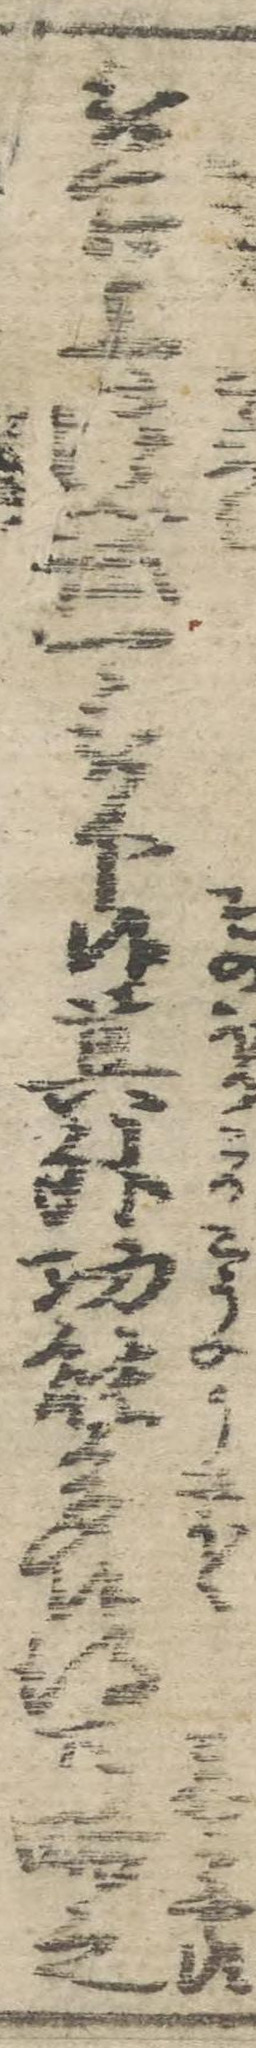被上可被下候其外功能多候得共略之
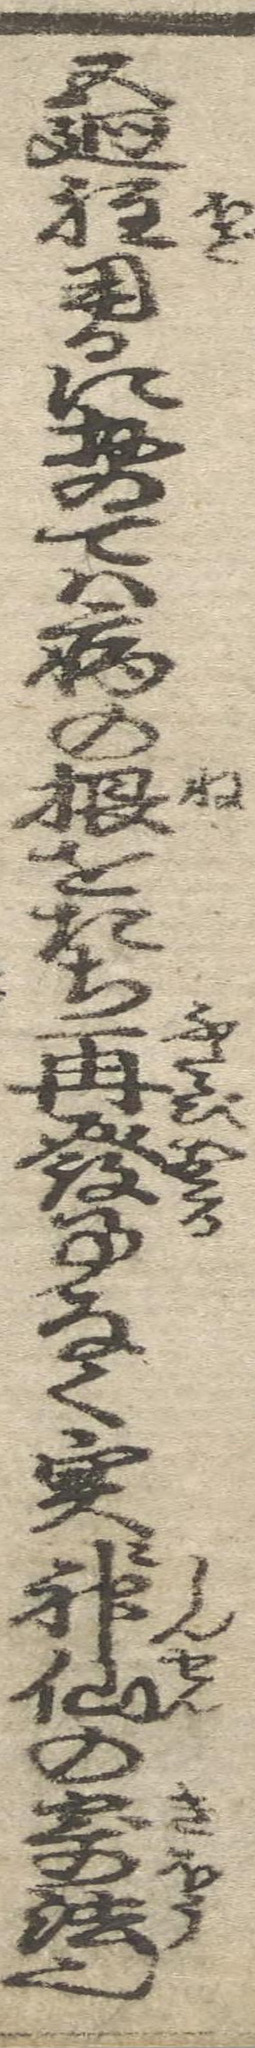五廻程用るにおゐては病の根をたち再発事なく実に神仙の寄法也
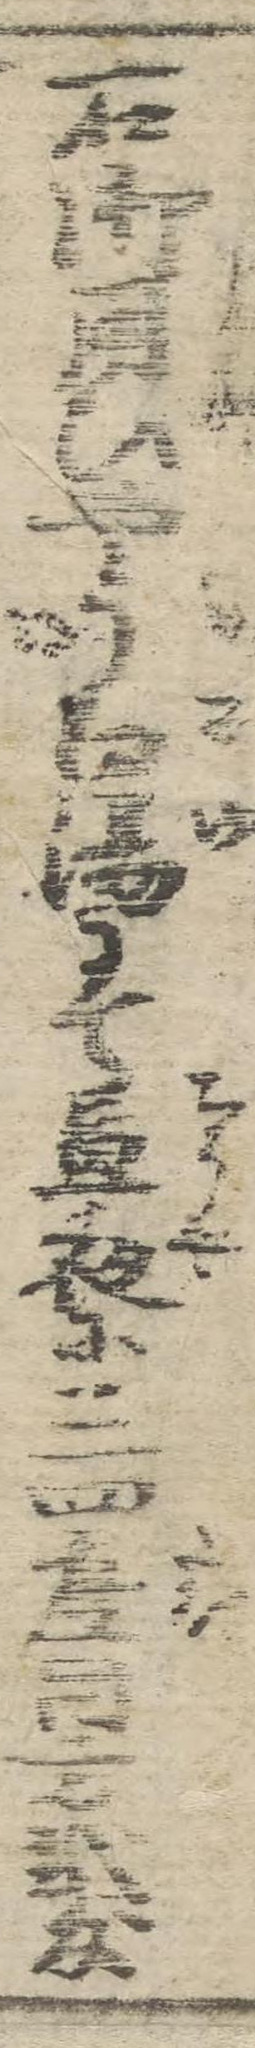右御用ひやう白湯にて昼夜に三四度目方弐匁
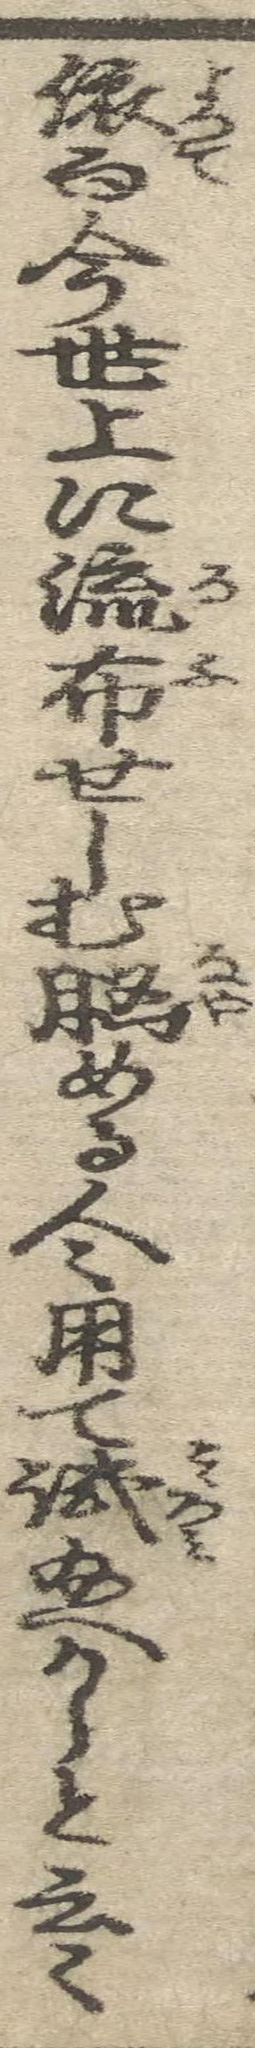依而今世上に流布せしむ悩める人々用て試給へかしと云々
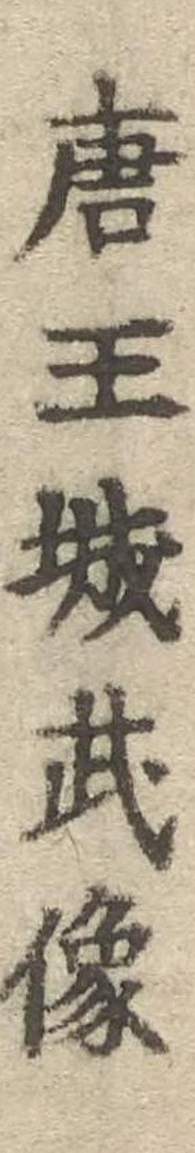唐王城武像
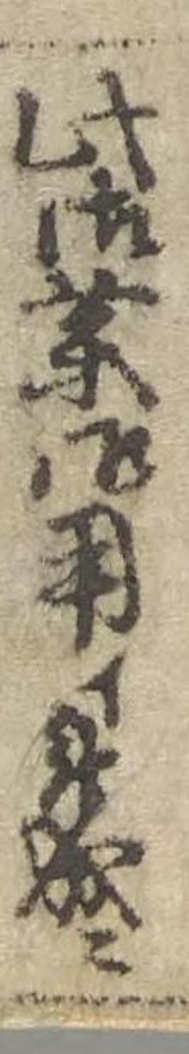此御薬御用イ被成ニ
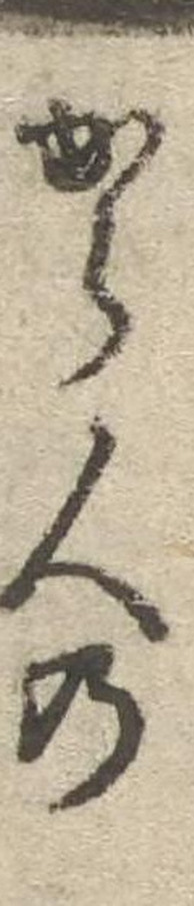から人の
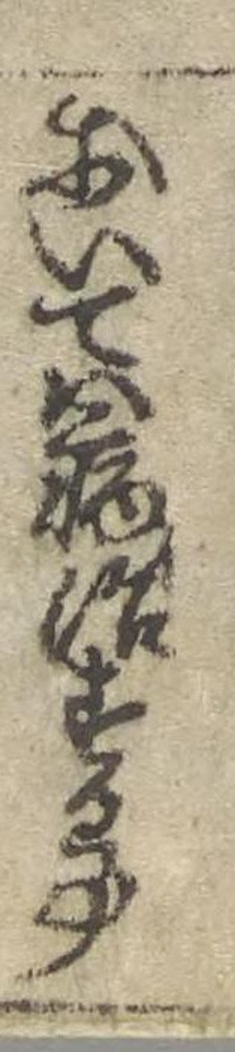おいては病治する事
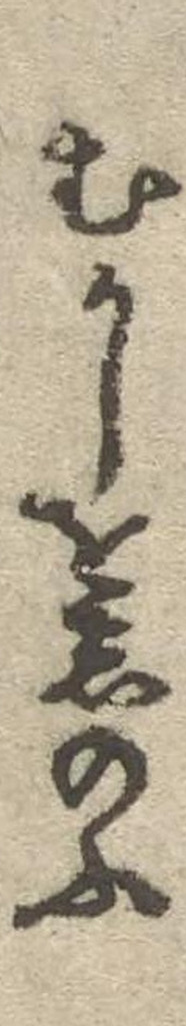むかしをしのふ
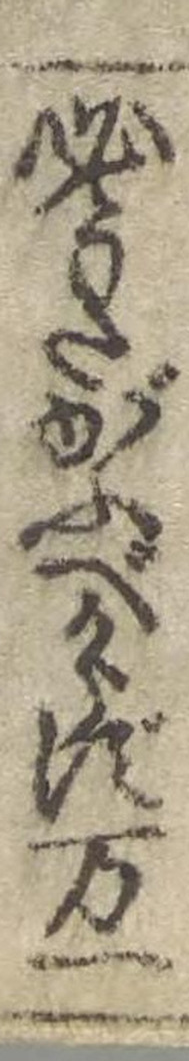必うたがふべからず万一
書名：浪華薬種問屋能書張交帖. 二
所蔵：国立国会図書館 National Diet Library, JAPAN
